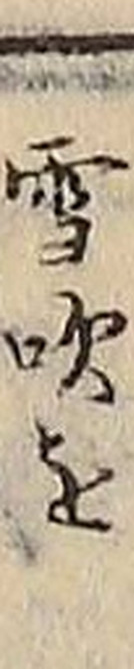雪吹を
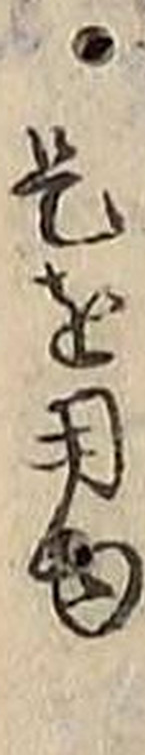是を用ゆ
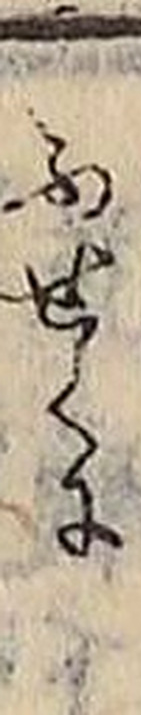ふせくに
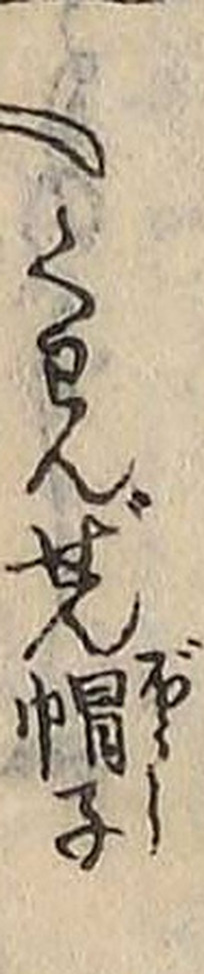くわんぜん帽子
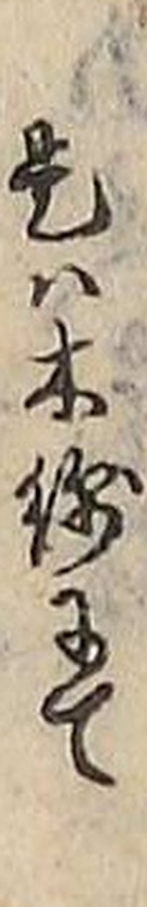是は木綿にて
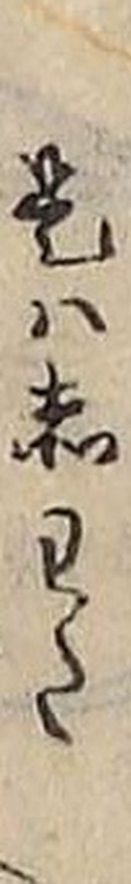是は赤わた
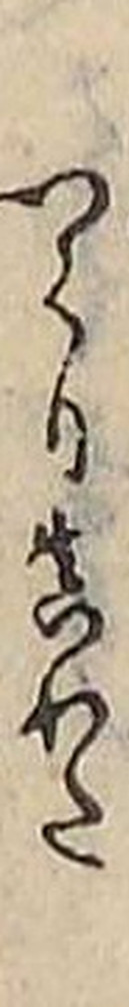つくり真わた
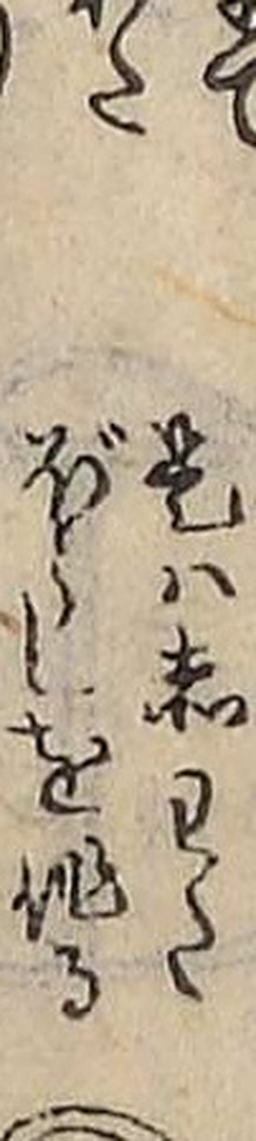ぼうしを作る
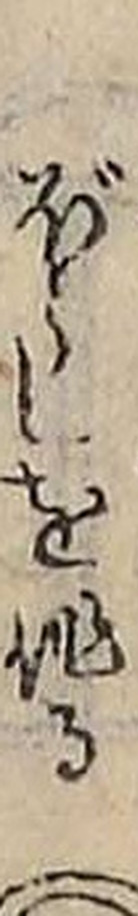ぼうしを作る
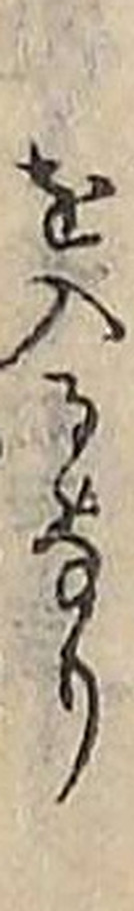を入るなり
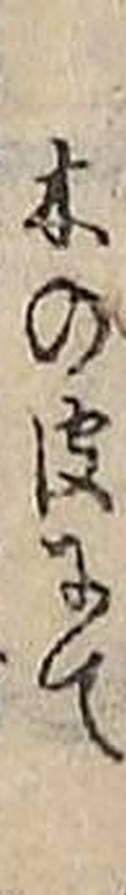木の皮にて
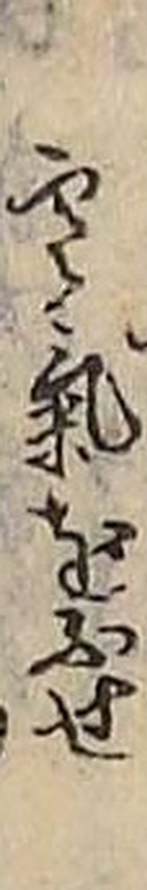寒気をふせ
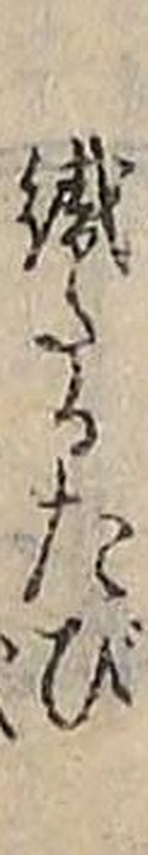織たるたび
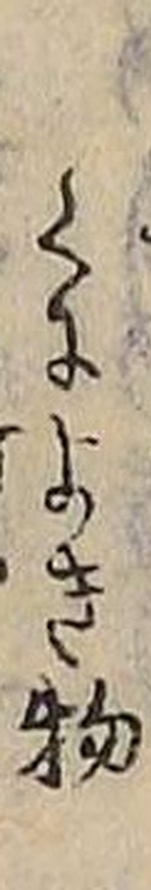くによき物
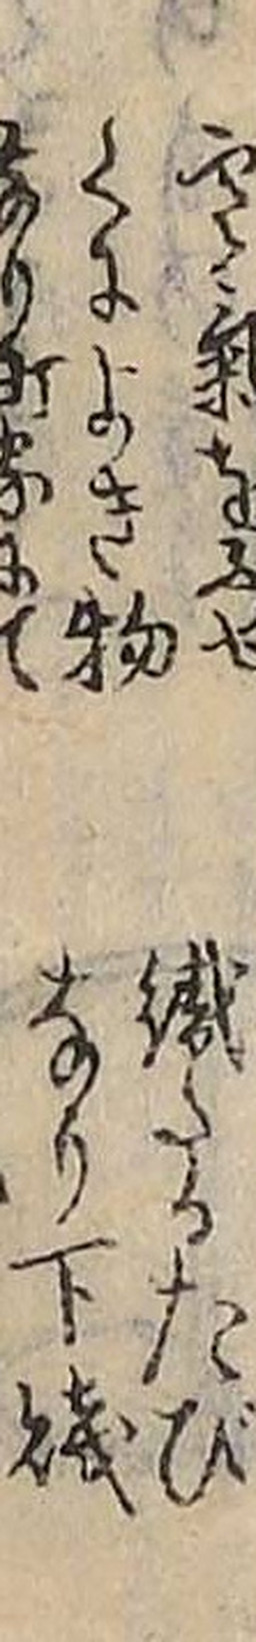なり町家にて
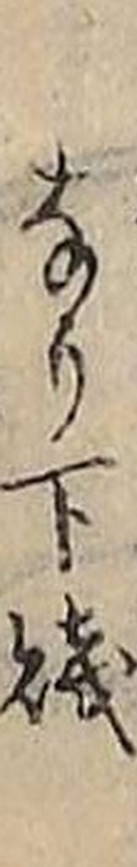なり下賤
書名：旅行用心集
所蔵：神戸大学附属図書館 国文学研究資料館
